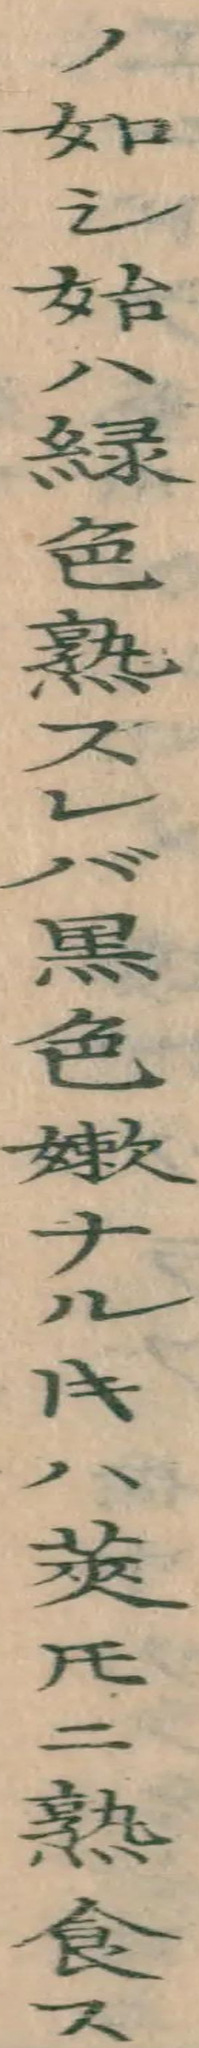ノ如シ始ハ緑色熟スレバ黒色嫩ナルトキハ莢トモニ熟食ス
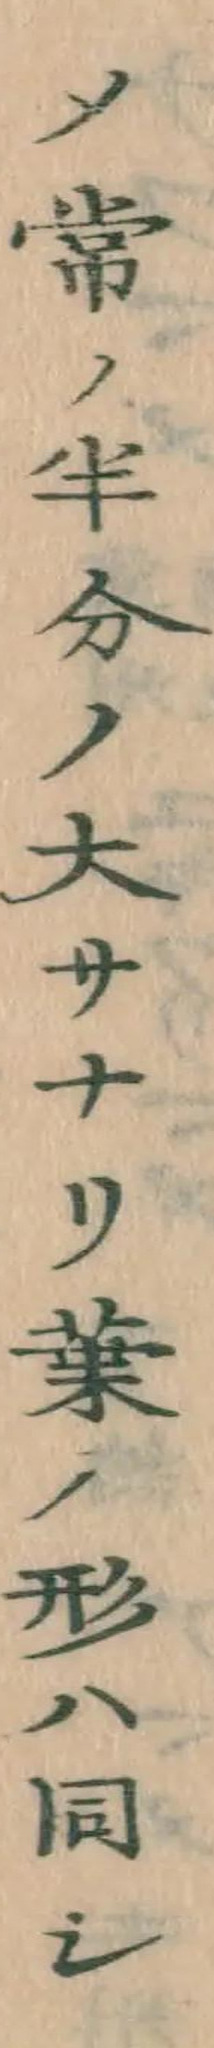シテ常ノ半分ノ大サナリ葉ノ形ハ同シ
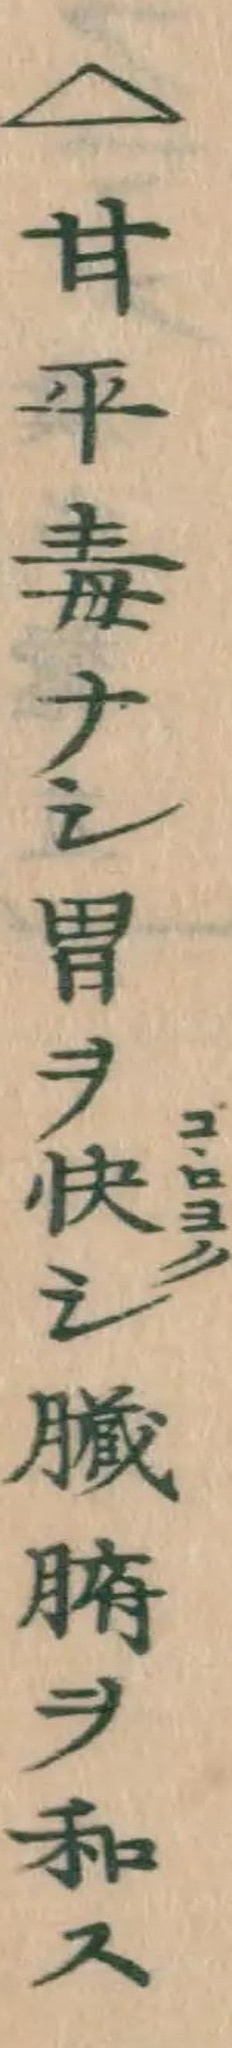△甘平毒ナシ胃ヲ快シ臓腑ヲ和ス

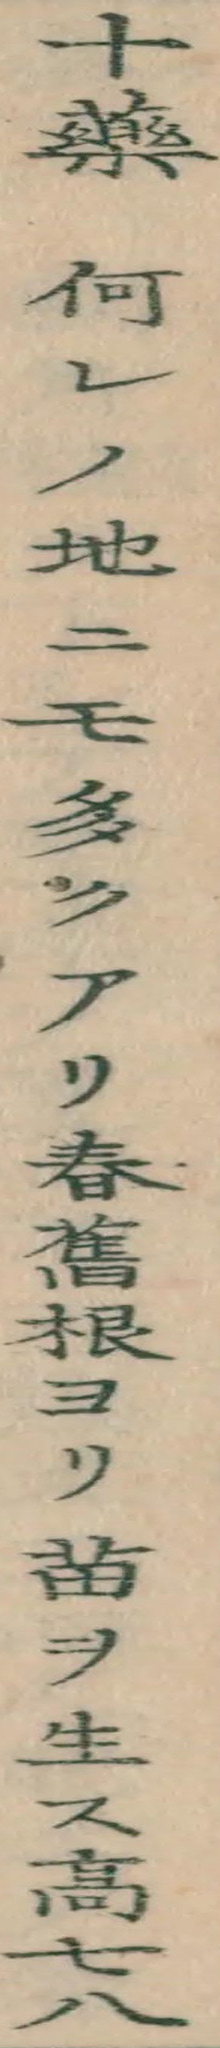十薬何レノ地ニモ多クアリ春旧根ヨリ苗ヲ生ス高七八
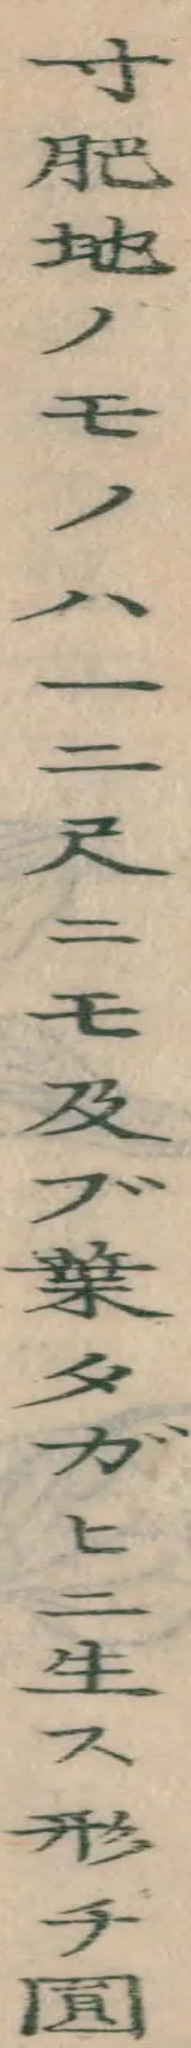寸肥地ノモノハ一二尺ニモ及ブ葉タガヒニ生ス形チ円
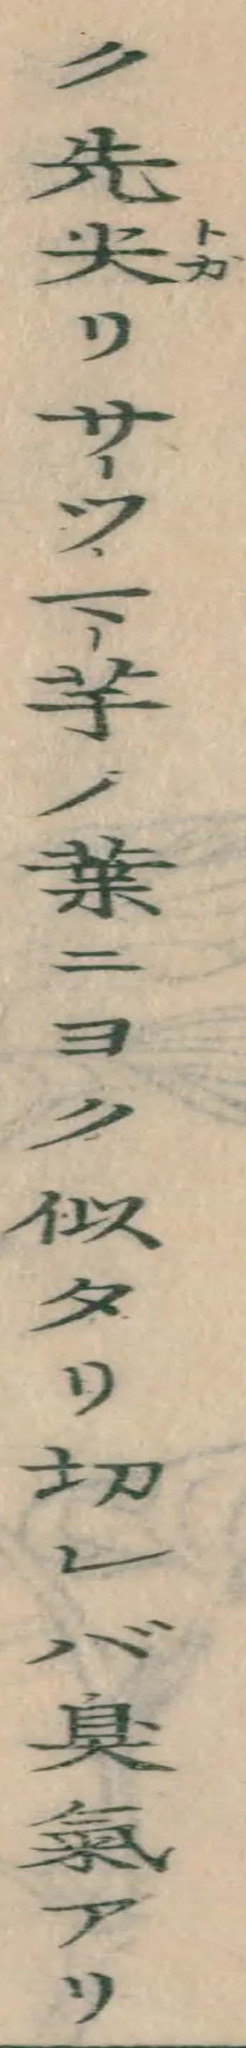ク先尖リサ-ツ-マ-芋ノ葉ニヨク似タリ切レバ臭気アリ
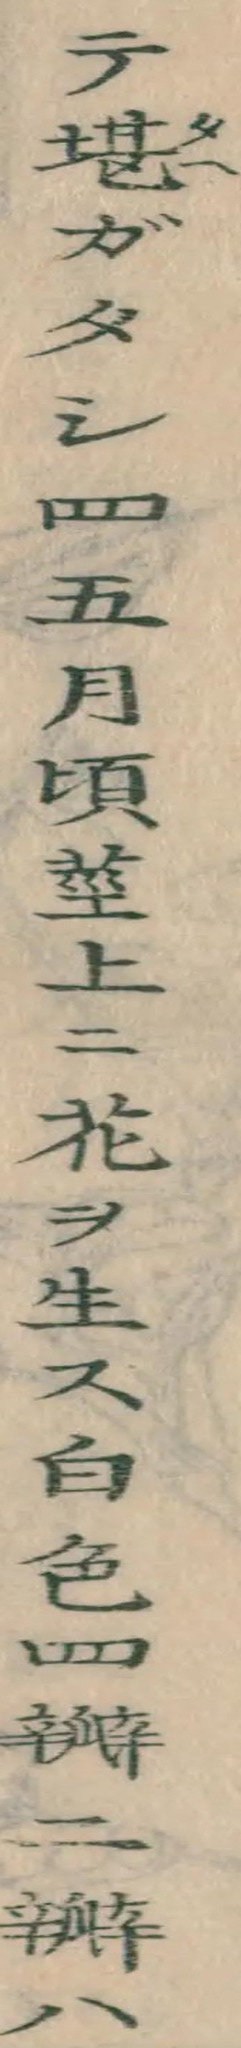テ堪ガタシ四五月頃茎上ニ花ヲ生ス白色四弁二弁ハ
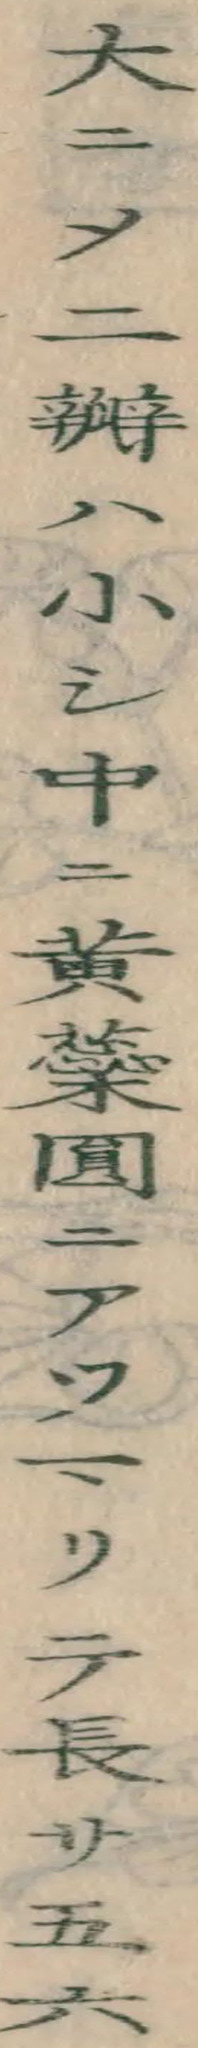大ニシテ二弁ハ小シ中ニ黄蕊円ニアツマリテ長サ五六
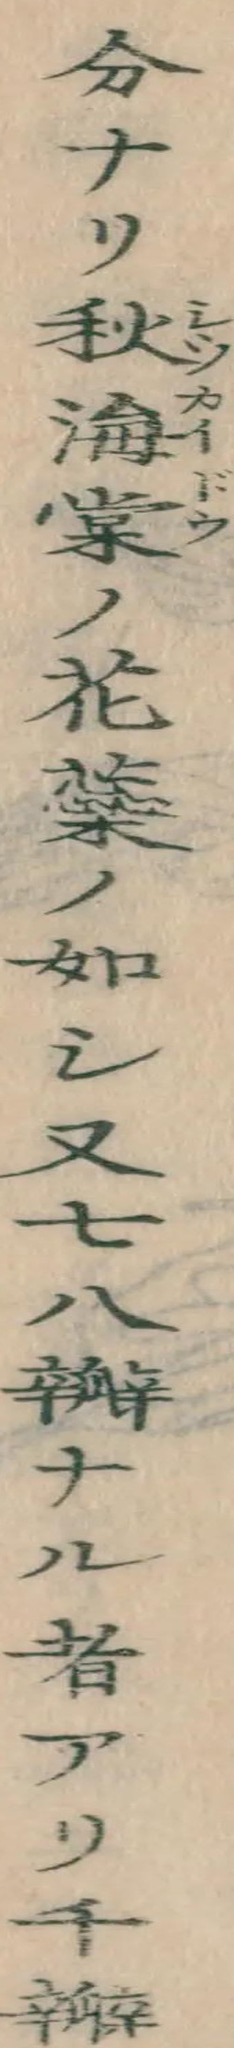分ナリ秋海棠ノ花蕊ノ如シ又七八弁ナル者アリ千弁
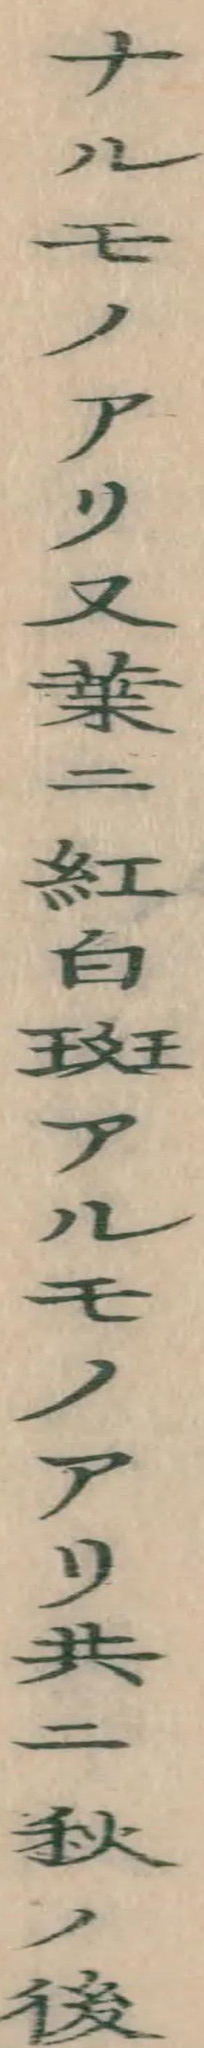ナルモノアリ又葉ニ紅白斑アルモノアリ共ニ秋ノ後
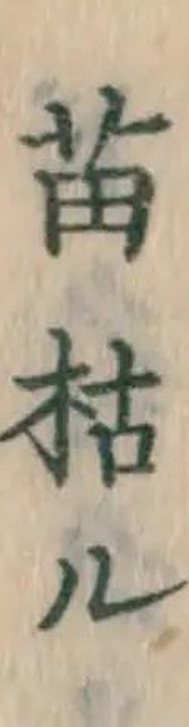苗枯ル
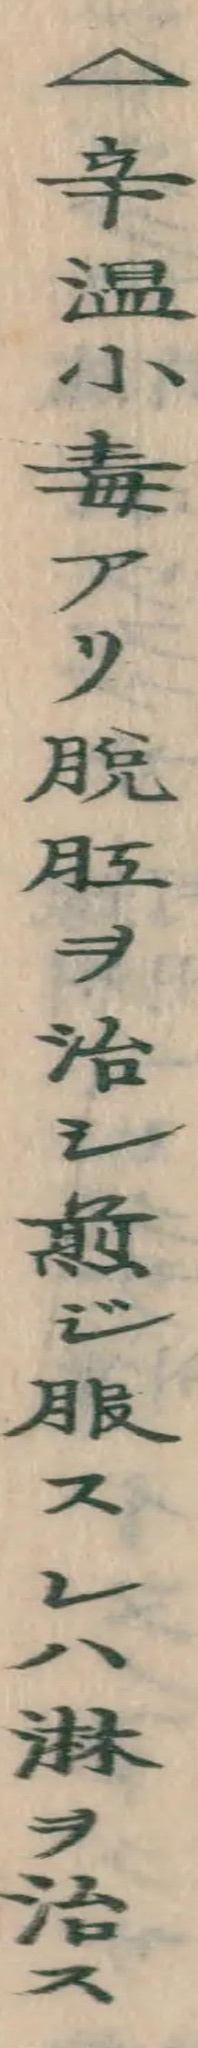△辛温小毒アリ脱肛ヲ治シ煎ジ服スレハ淋ヲ治ス
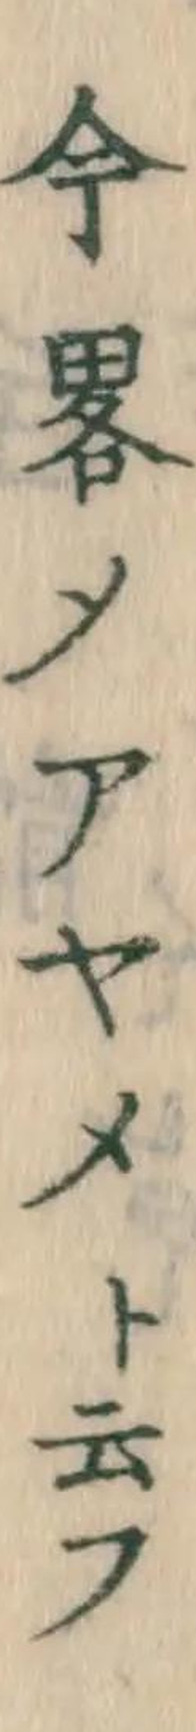今略シテアヤメ云フ

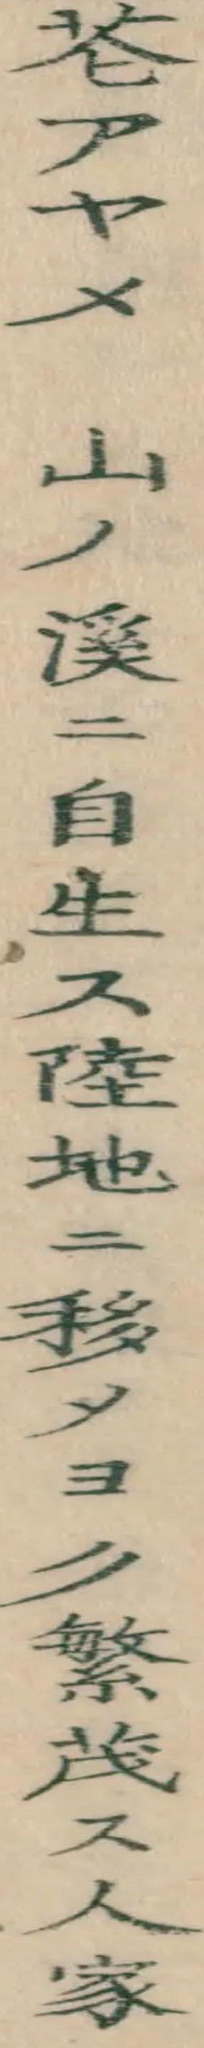花アヤメ山ノ渓ニ自生ス陸地ニ移シテヨク繁茂ス人家
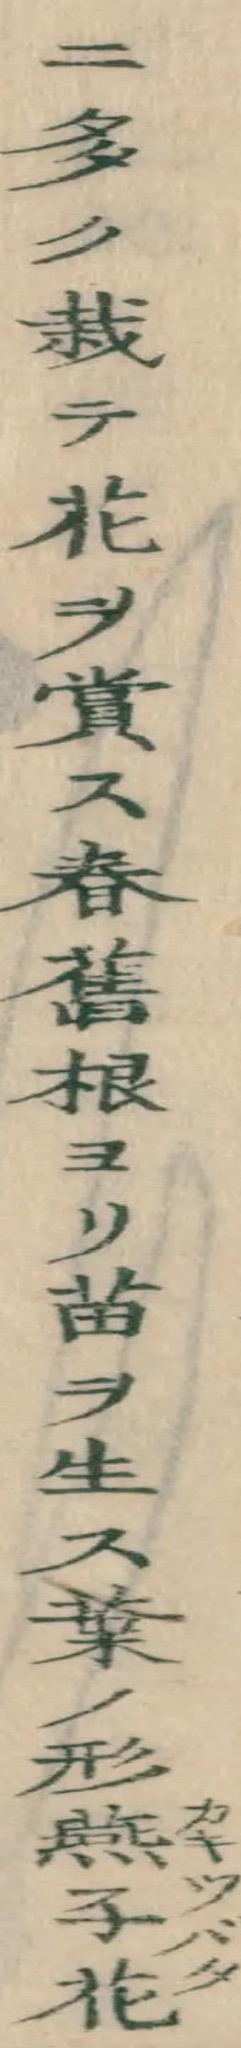ニ多ク栽テ花ヲ賞ス春旧根ヨリ苗ヲ生ス葉ノ形燕子花
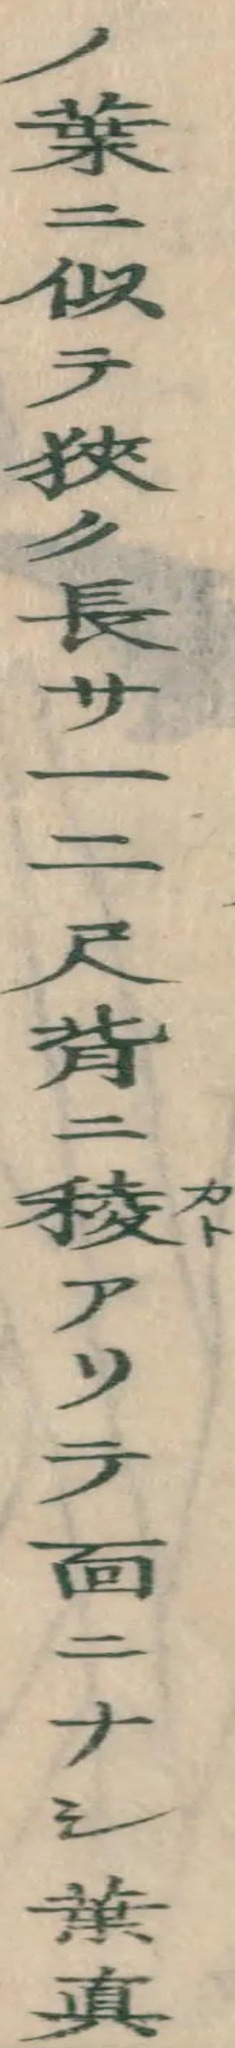ノ葉ニ似テ狭ク長サ一二尺背ニ稜アリテ面ニナシ葉真
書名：これこれ草 2巻. [2]
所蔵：国立国会図書館 National Diet Library, JAPAN
